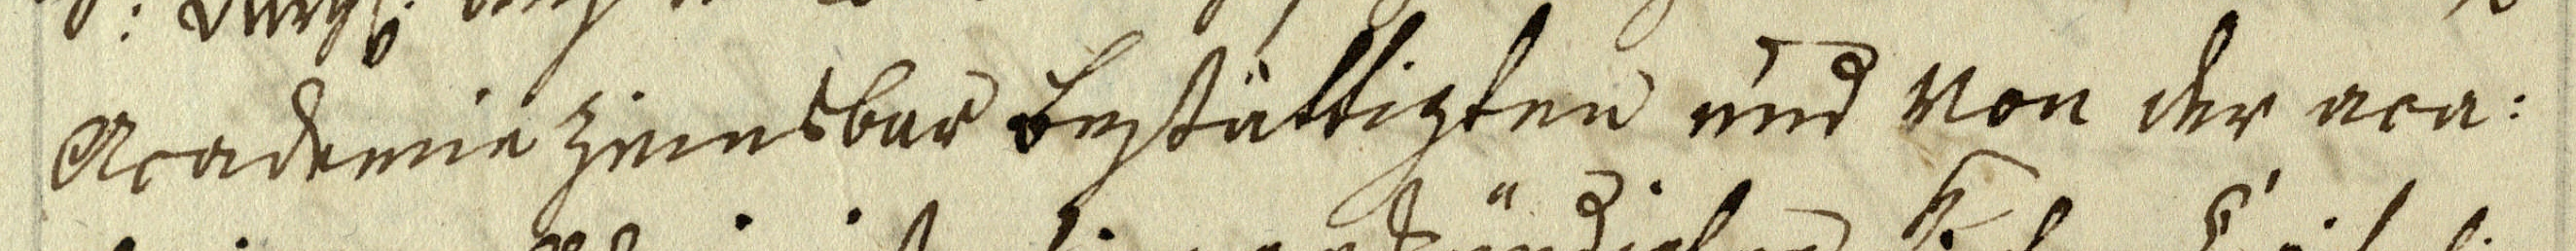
Academie zinnsbar bestättigten und von der aca¬
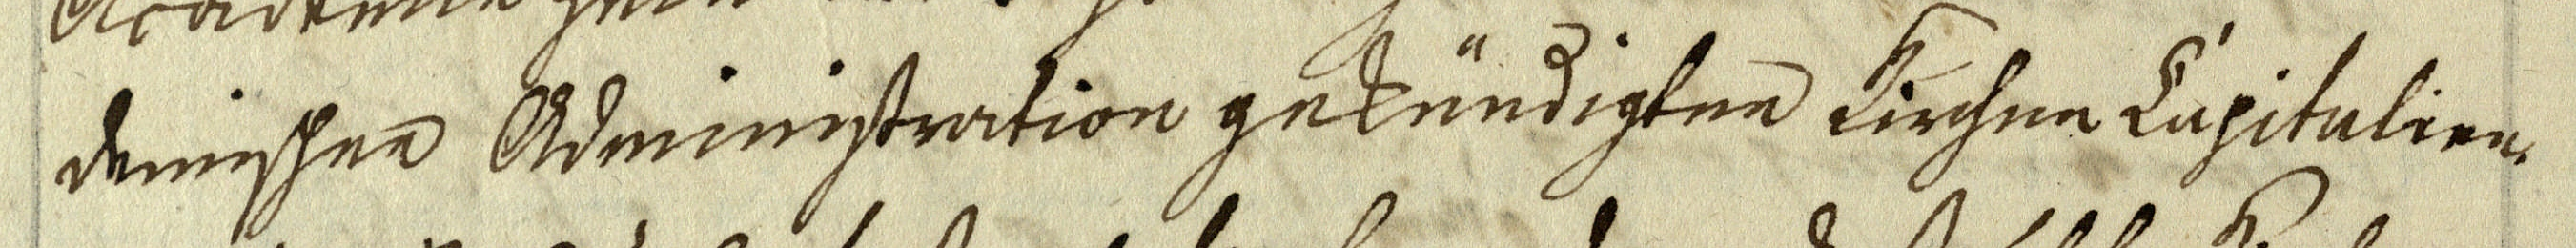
demischen Administration gekündigten Kirchen Capitalien,
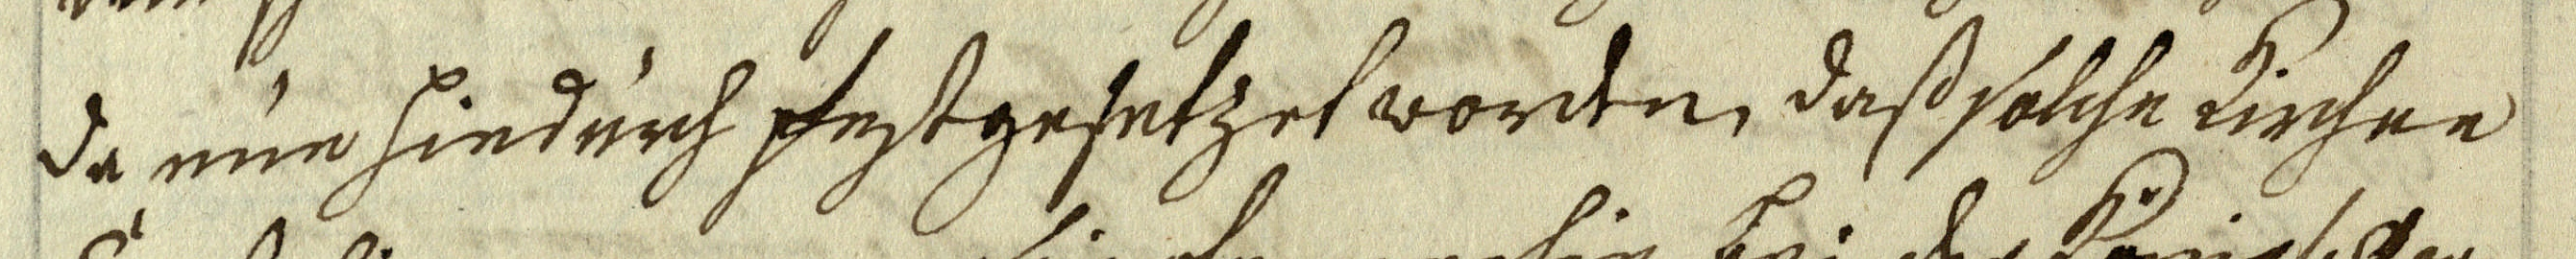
da nun hiedurch festgesetzet worden, daß solche Kirchen
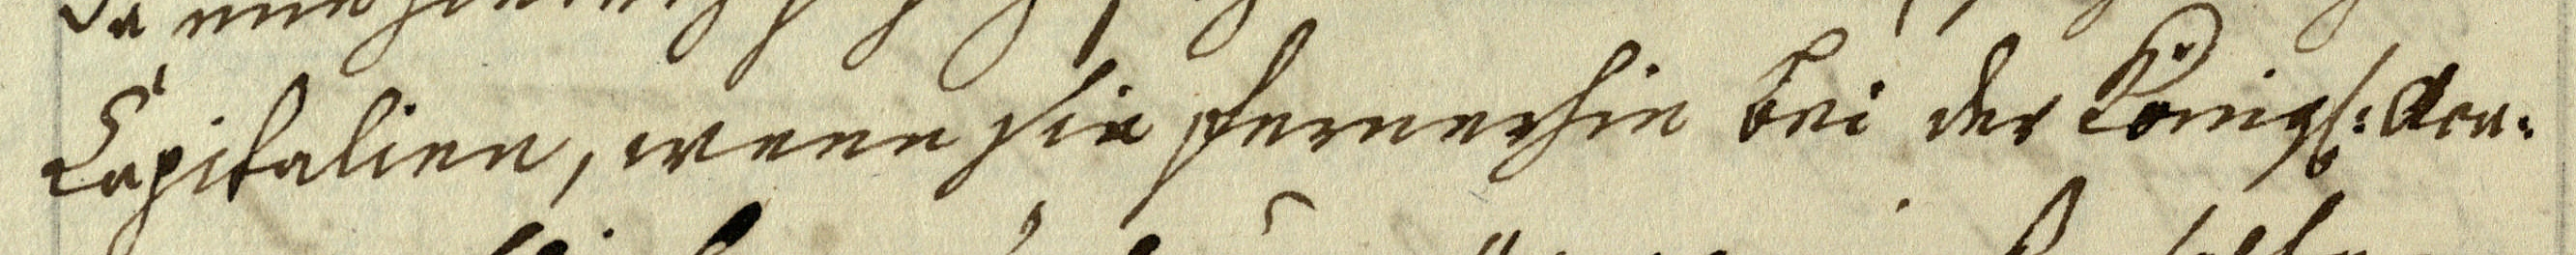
capitalien, wenn sie fernerhin bei der Königl. Aca¬
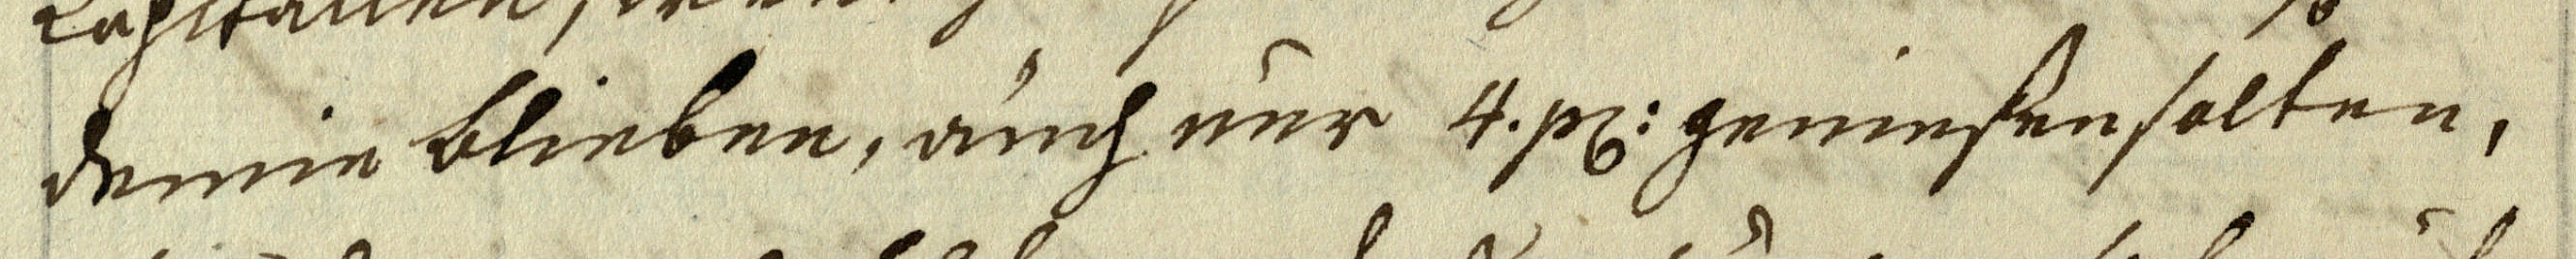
demie blieben, auch nur 4. p. genießen solten,
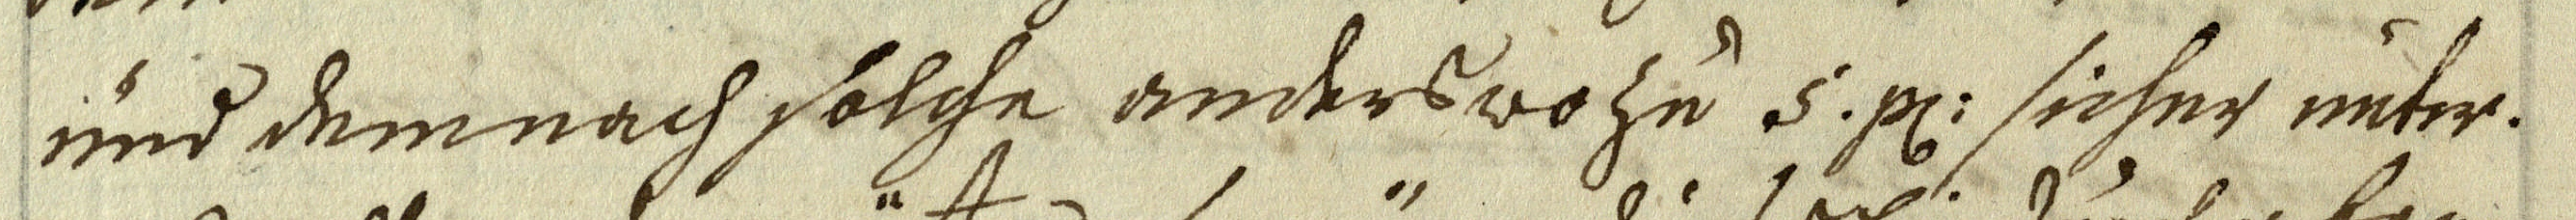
und demnach solche anderswo zu 5. p. sicher unter¬
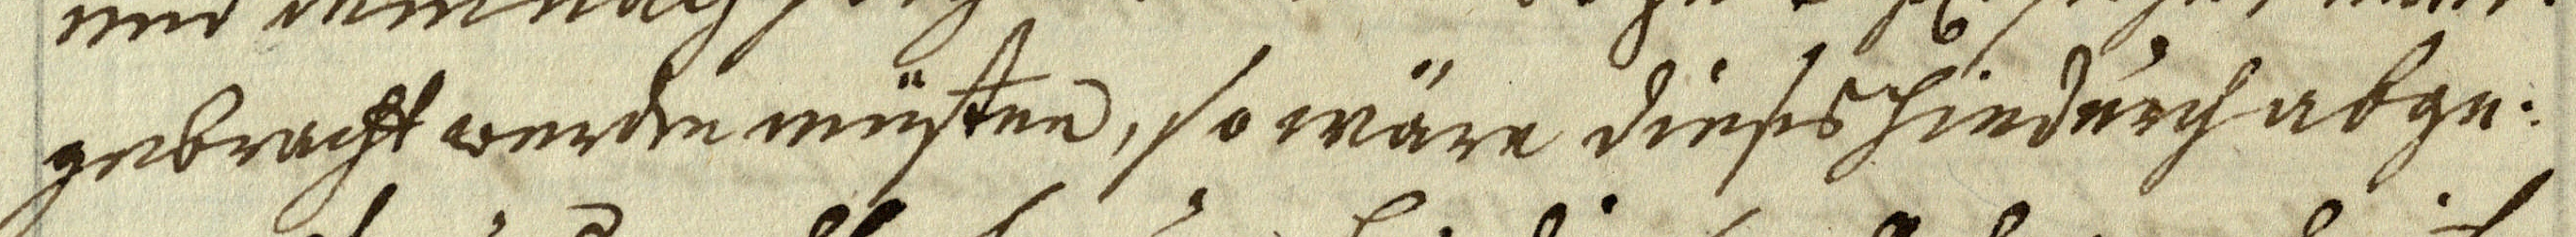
gebracht werden müsten, so wäre dieses hiedurch abge¬
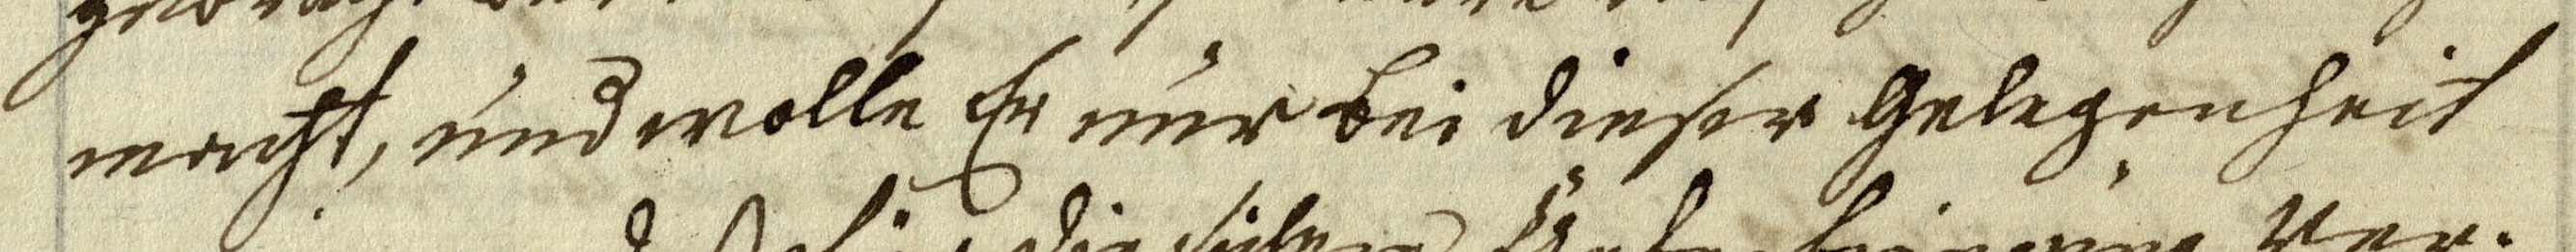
macht, und wolle Er nur bei dieser Gelegenheit
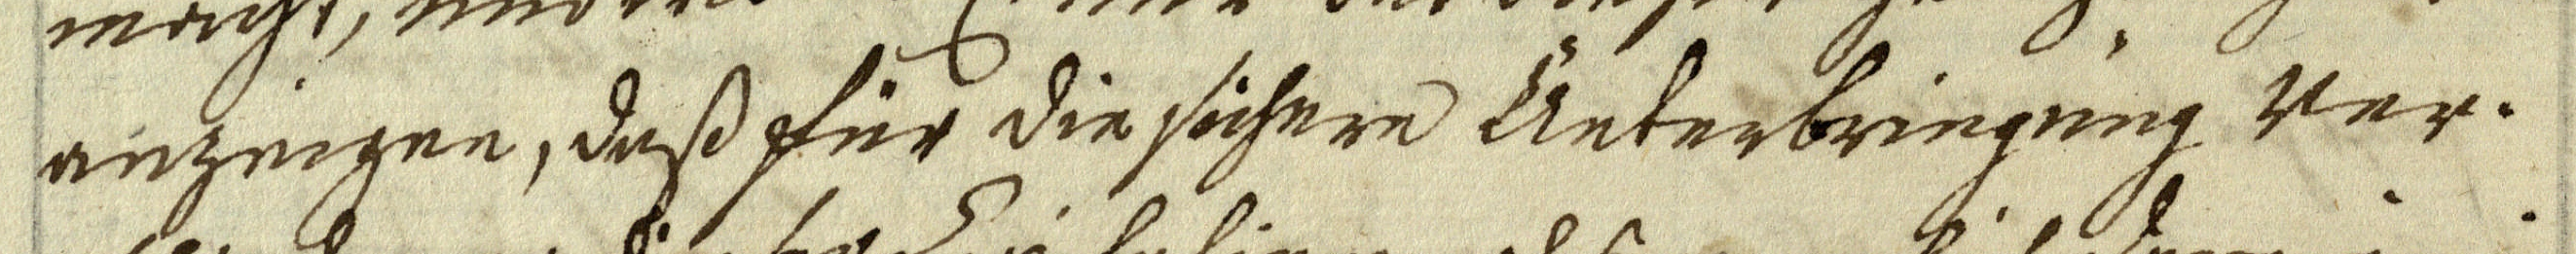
anzeigen, daß für die sichere Unterbringung ver¬
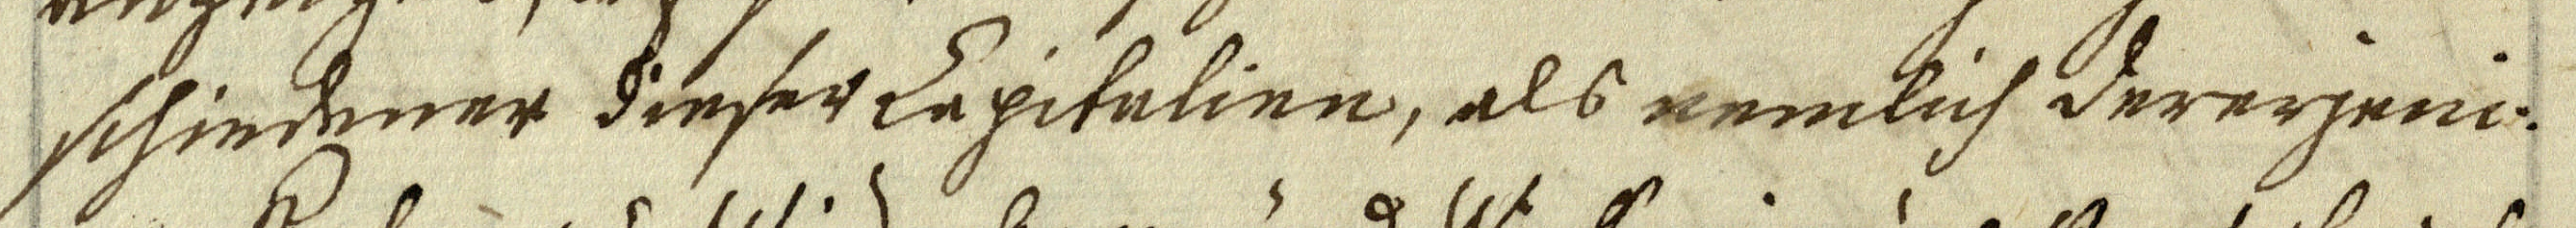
schiedener dieser Capitalien, als nemlich dererjeni¬
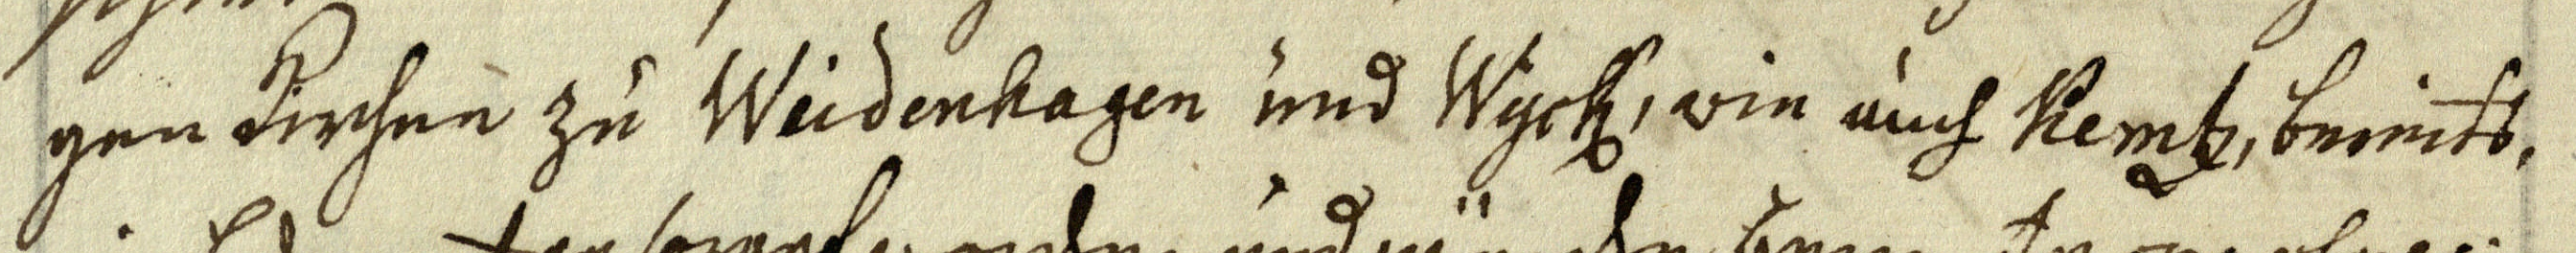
gen Kirchen zu Weidenhagen und Wÿck, wie auch Kemtz, bereits,
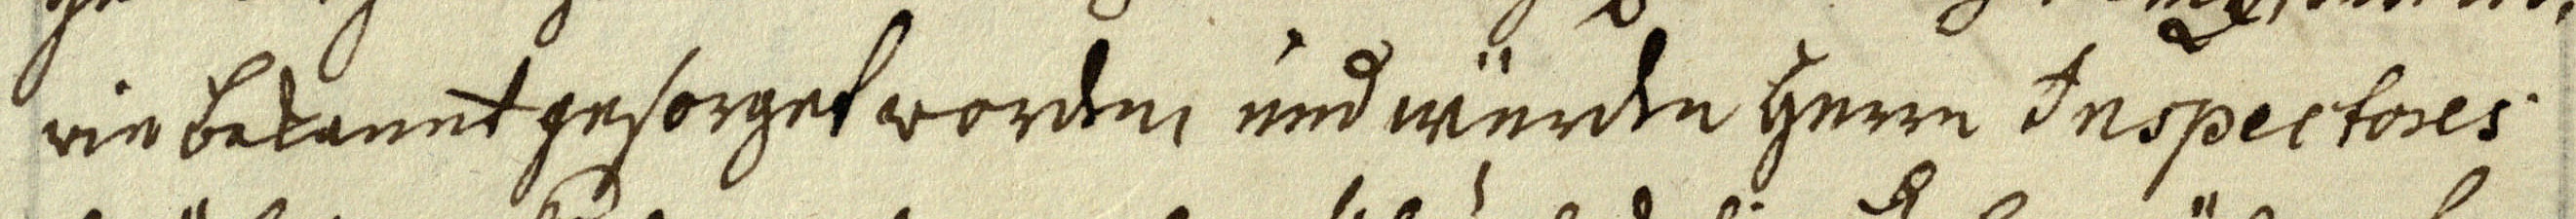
wie bekannt gesorget worden,, und würden Herrn Inspectores
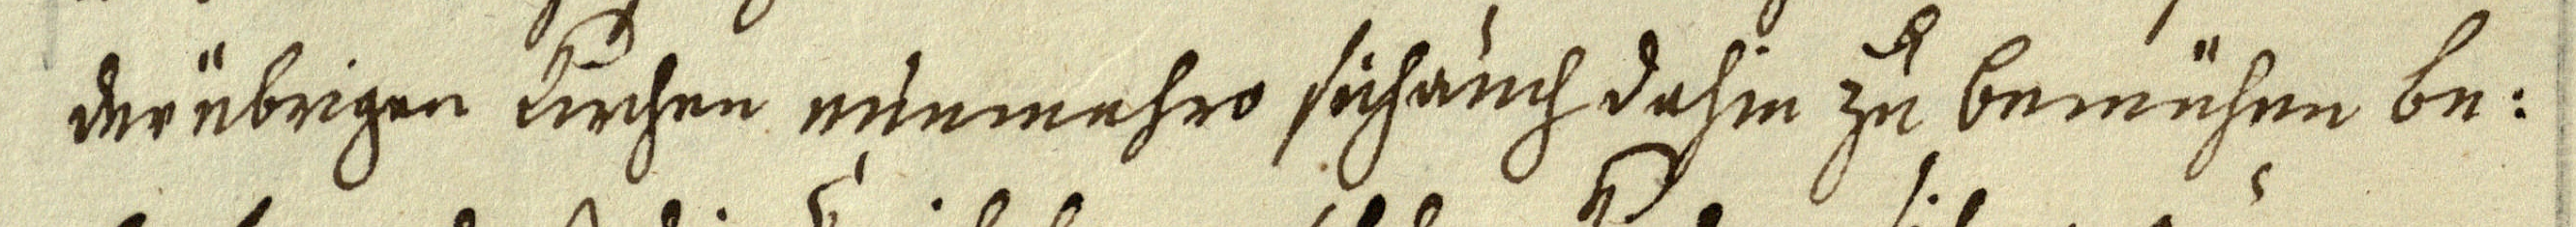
der übrigen Kirchen nunmehro sich auch dahin zu bemühen be¬
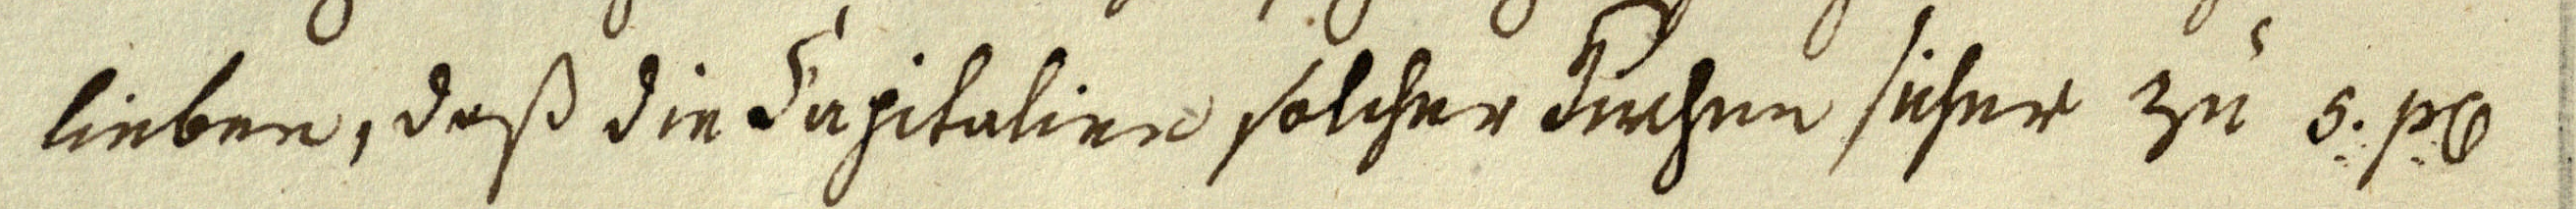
lieben, daß die Capitalien solcher Kirchen sicher zu 5. p.
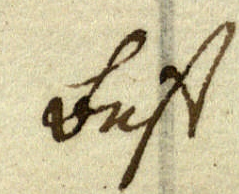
best
